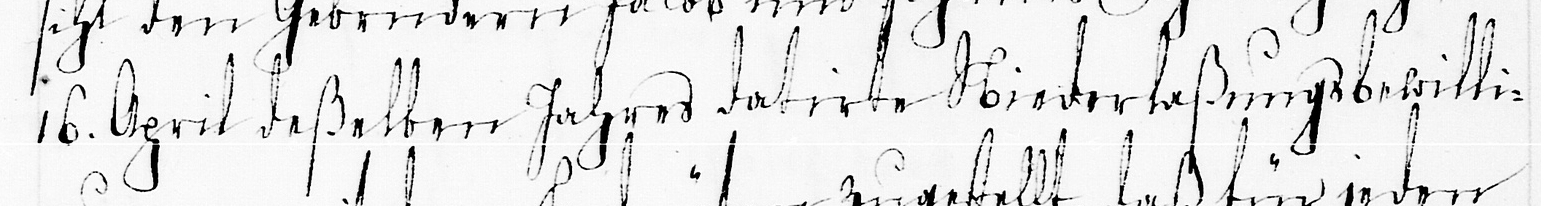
16. April deßelben Jahres datirte Niederlaßungsbewilli¬
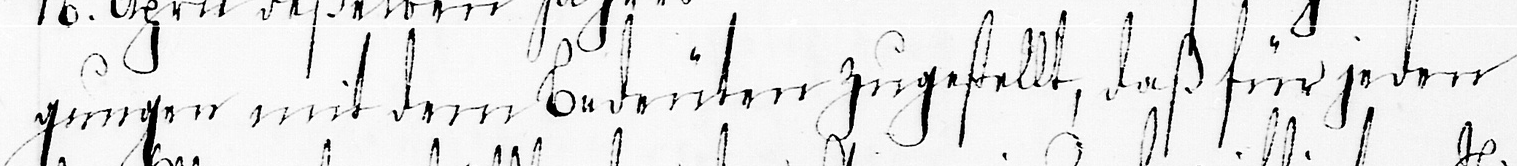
gungen mit dem Bedeuten zugestellt, daß für jeden
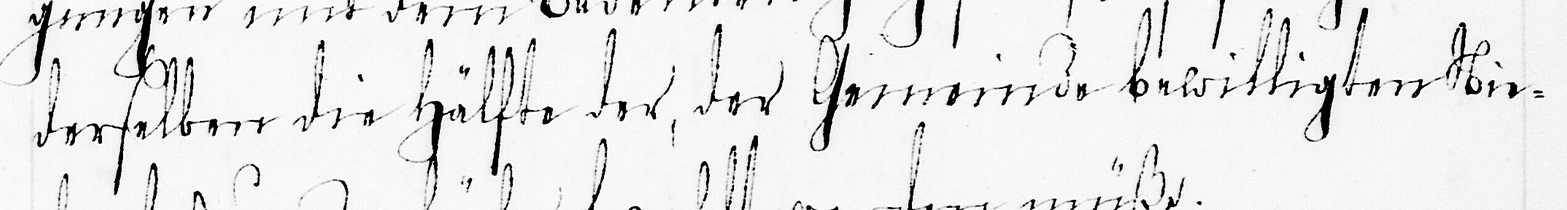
derselben die Hälfte der, der Gemeinde bewilligten Nie¬
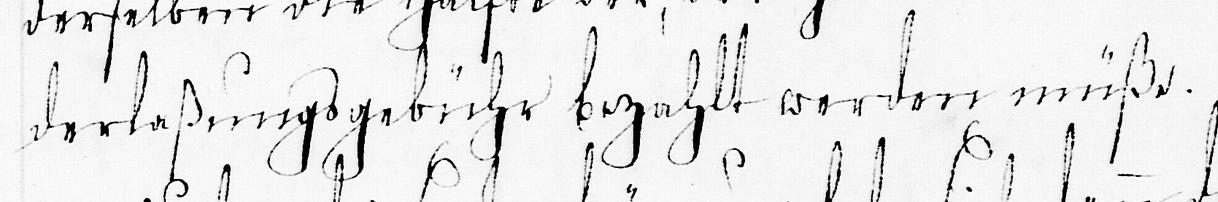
derlaßungsgebühr bezahlt werden müße.
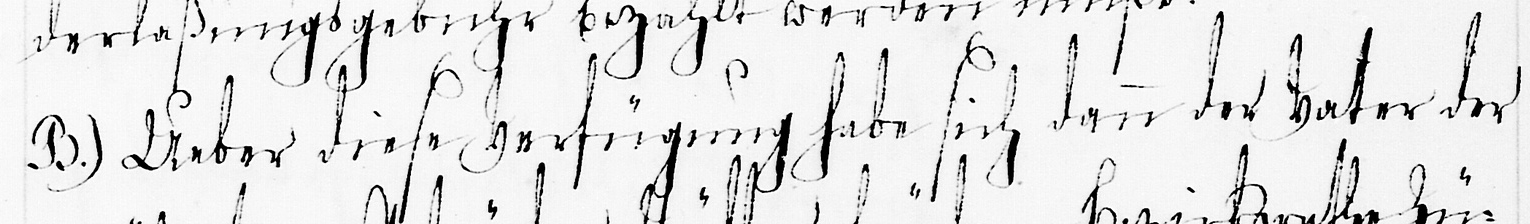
B.) Ueber diese Verfügung habe sich dann der Vater der
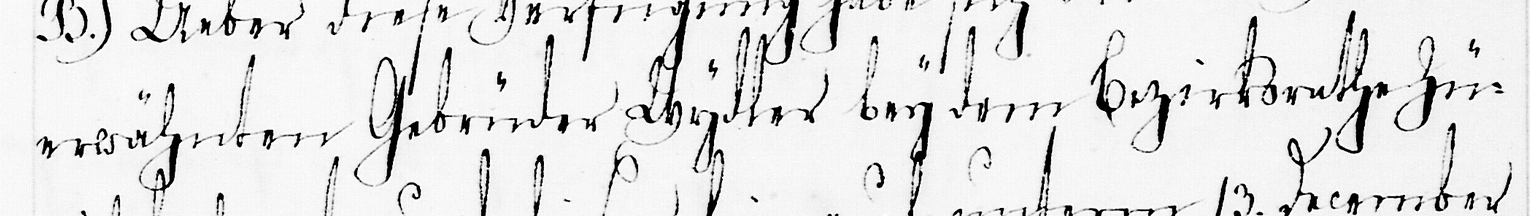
erwähnten Gebrüder Wydler bey dem Bezirksrathe Zü¬
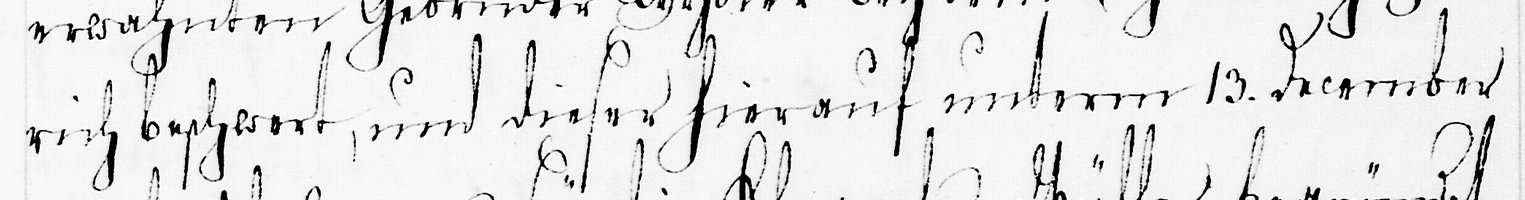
rich beschwert, und dieser hierauf unterm 13. December
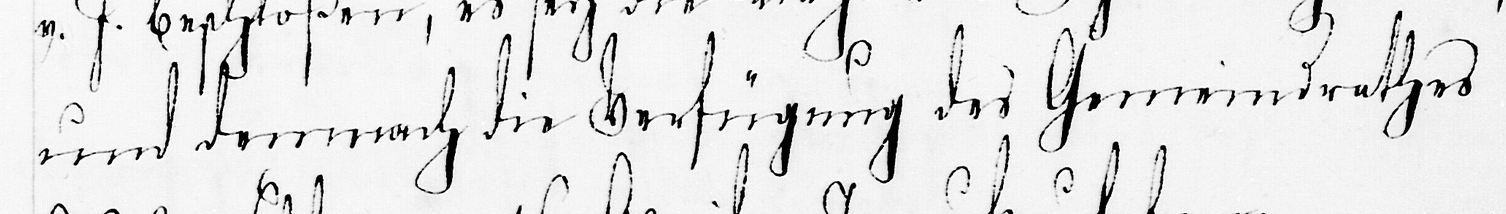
und demnach die Verfügung des Gemeindrathes
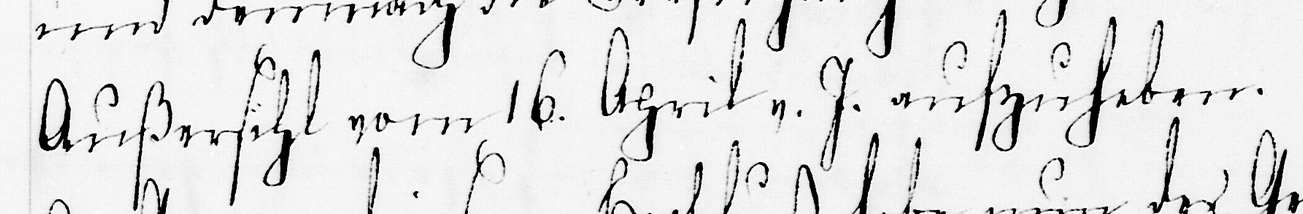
Außersihl vom 16. April v. J. aufzuheben.
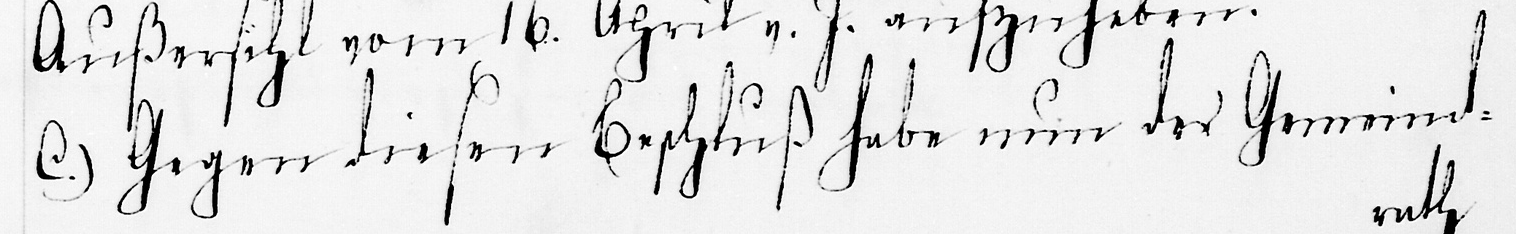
C.) Gegen diesen Beschluß habe nun der Gemeind-
